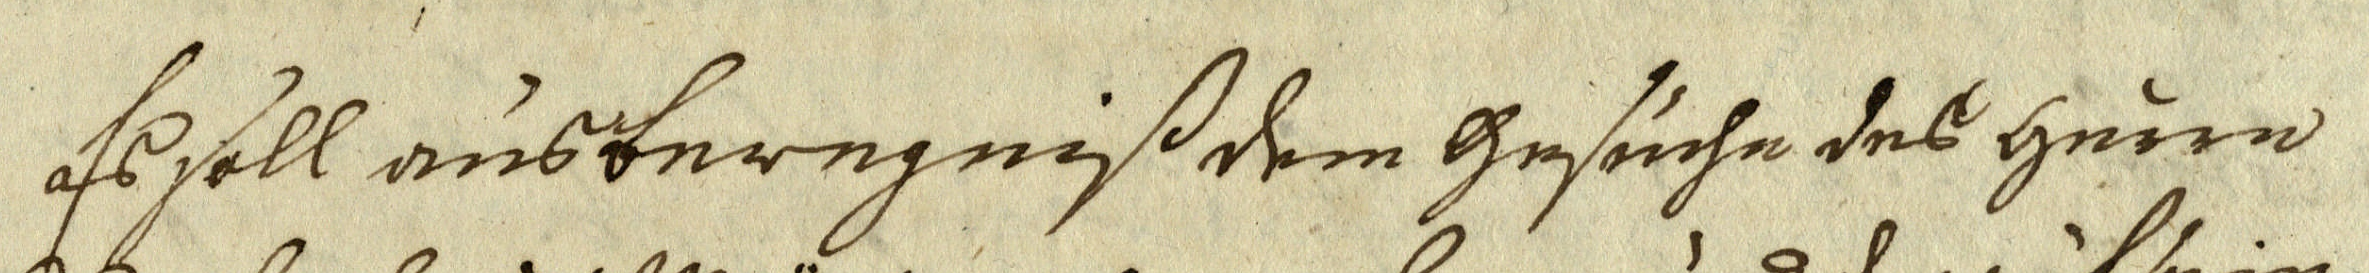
Es soll aus Bewegniß dem Gesuche des Herrn
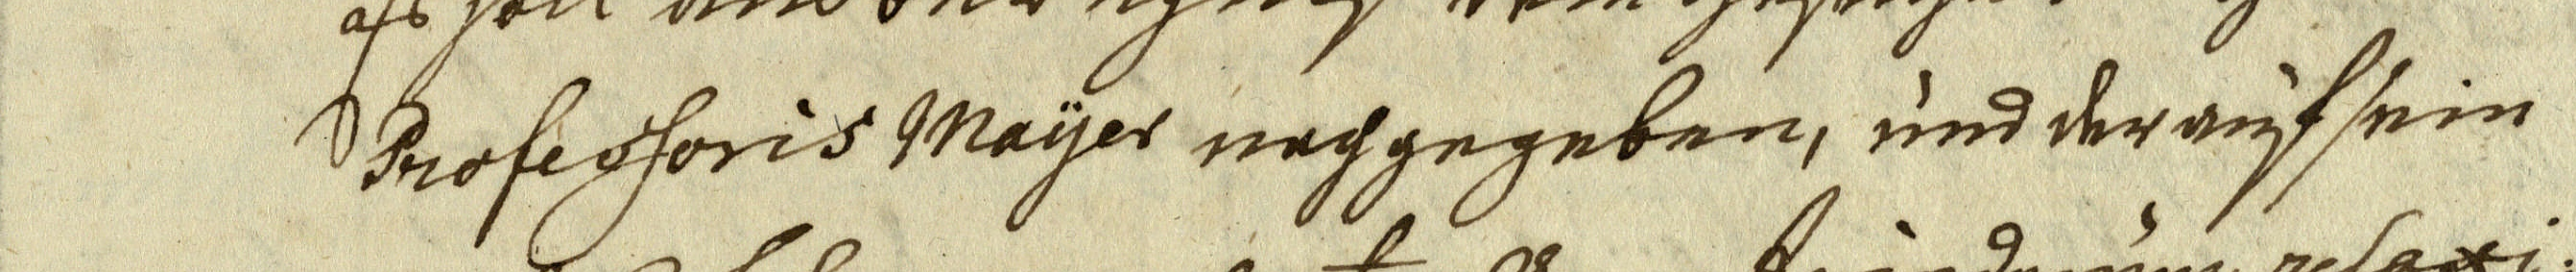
Professoris Maÿer nachgegeben, und der auf sein
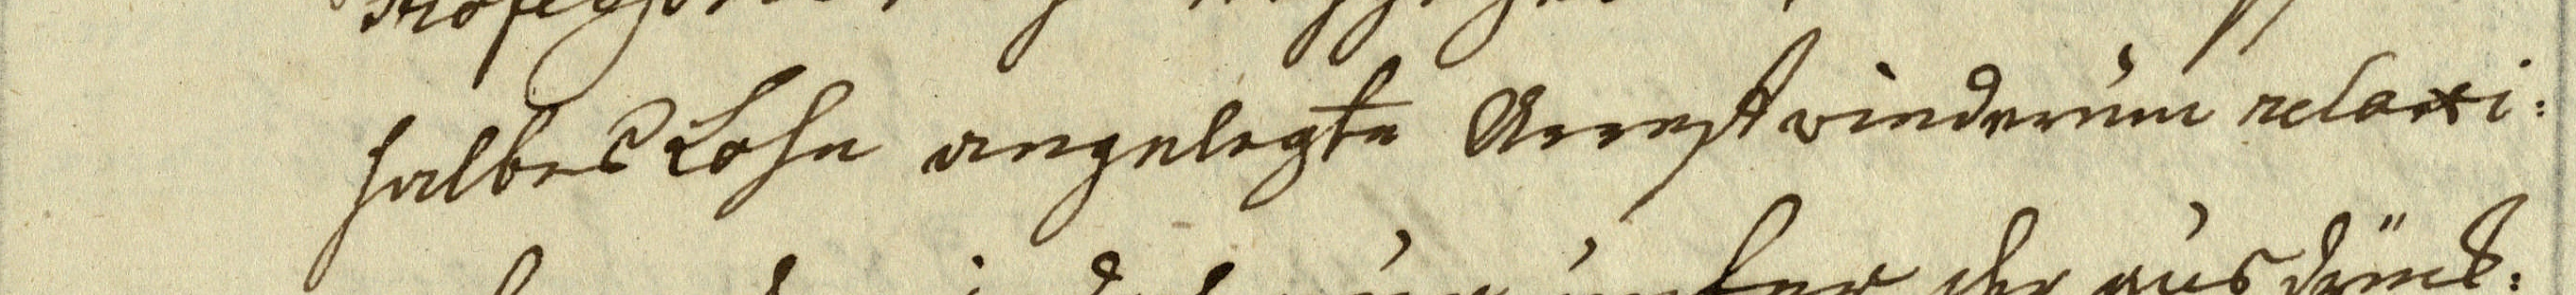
halbes Lohn angelegte Arrest wiederum relaxi¬
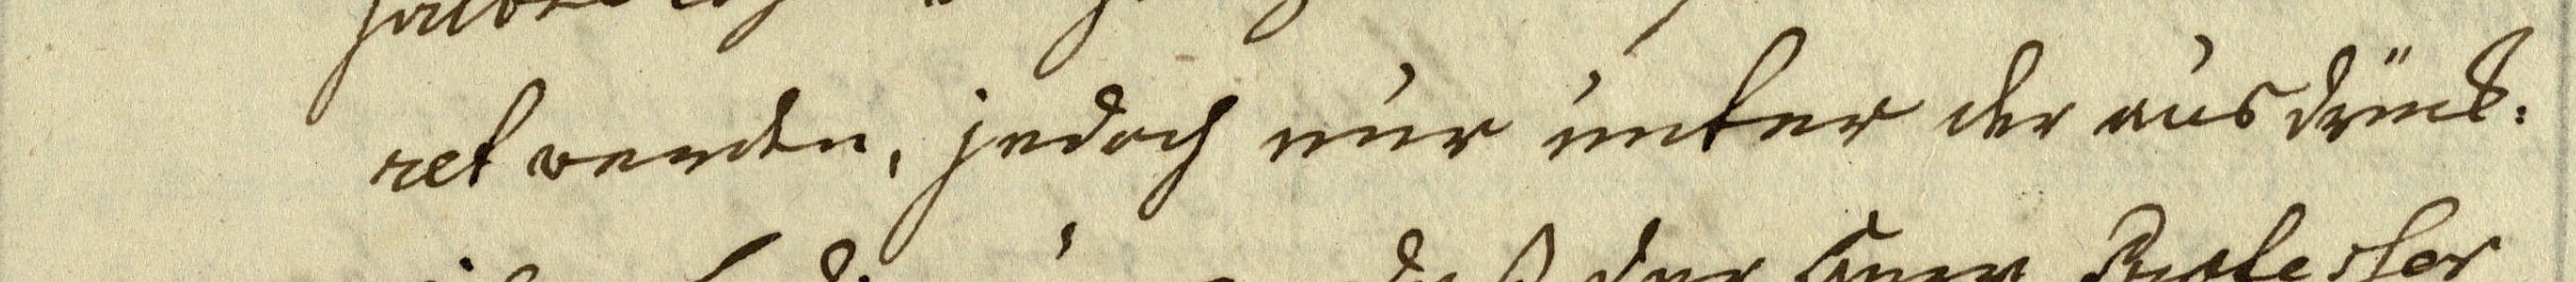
ret werden, jedoch nur unter der ausdrück¬
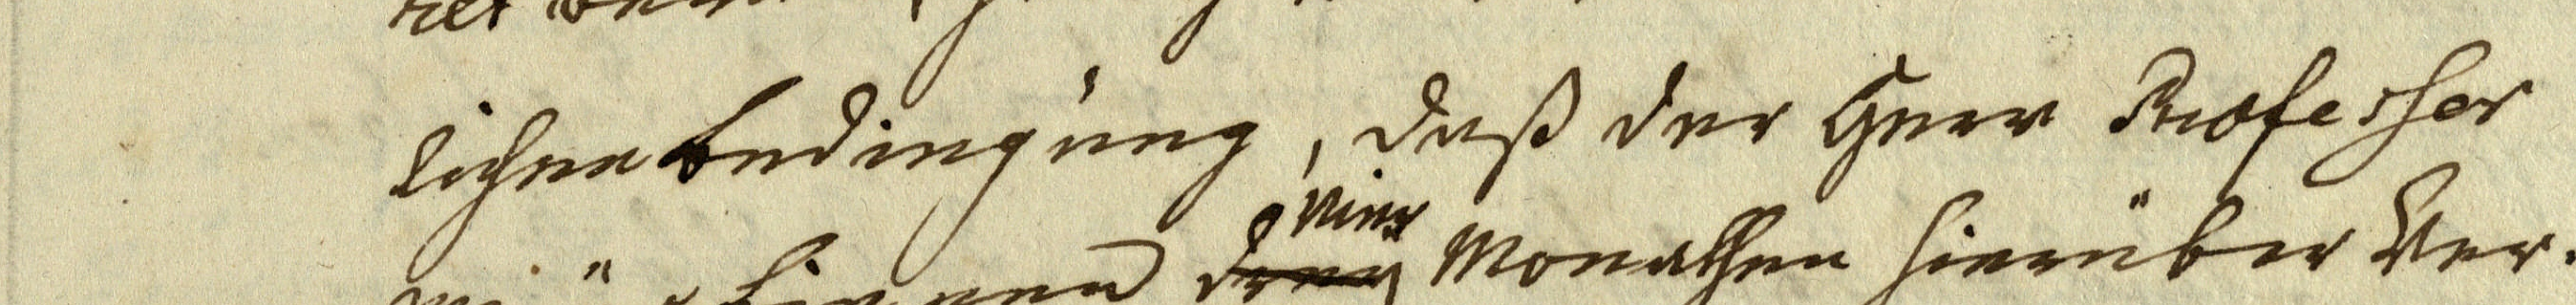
lichen Bedingung , daß der Herr Professor
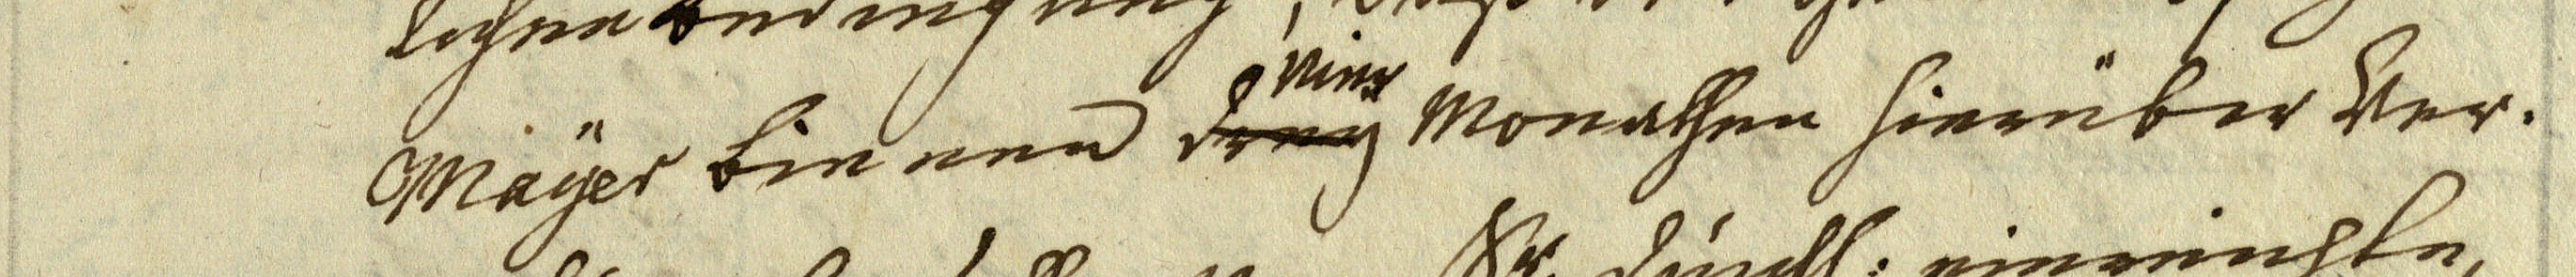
Maÿer binnen dreÿ vier Monathen hierüber Ver¬
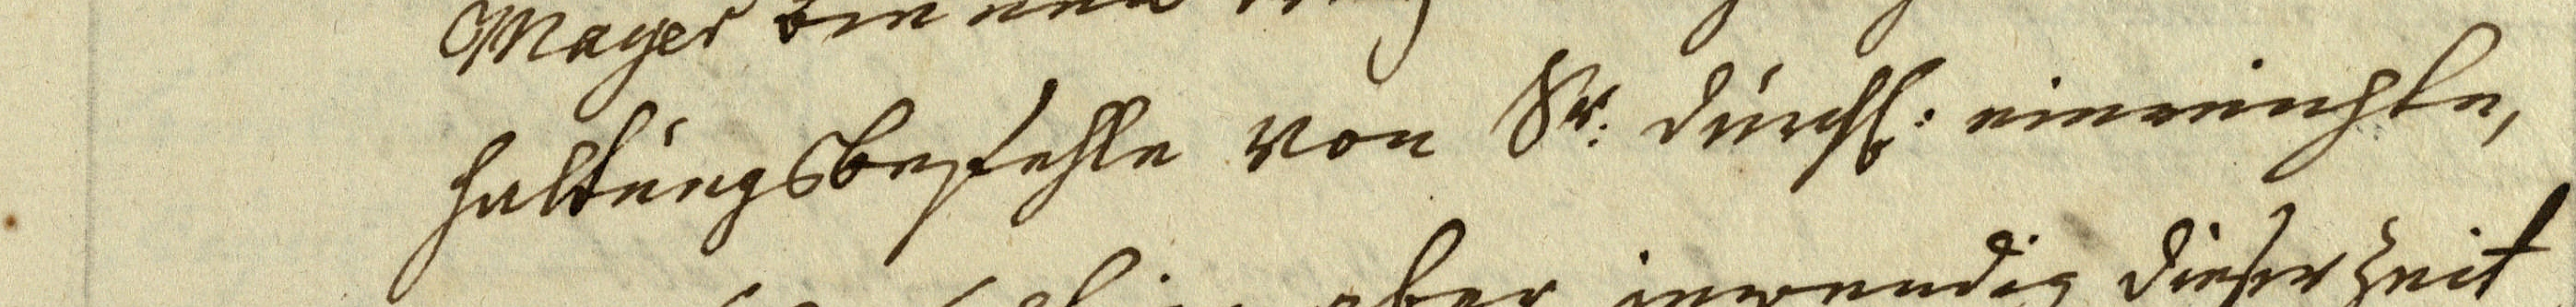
haltungsbefehle von Sr. Durchl. einreichte,
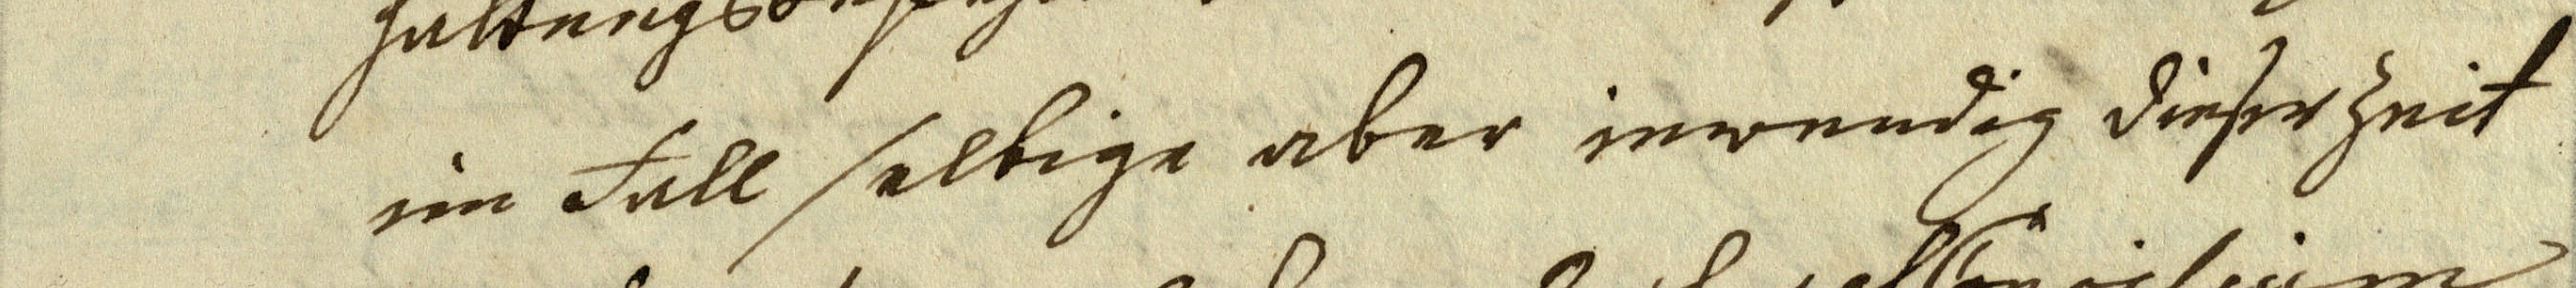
im Fall selbige aber inwendig dieser Zeit
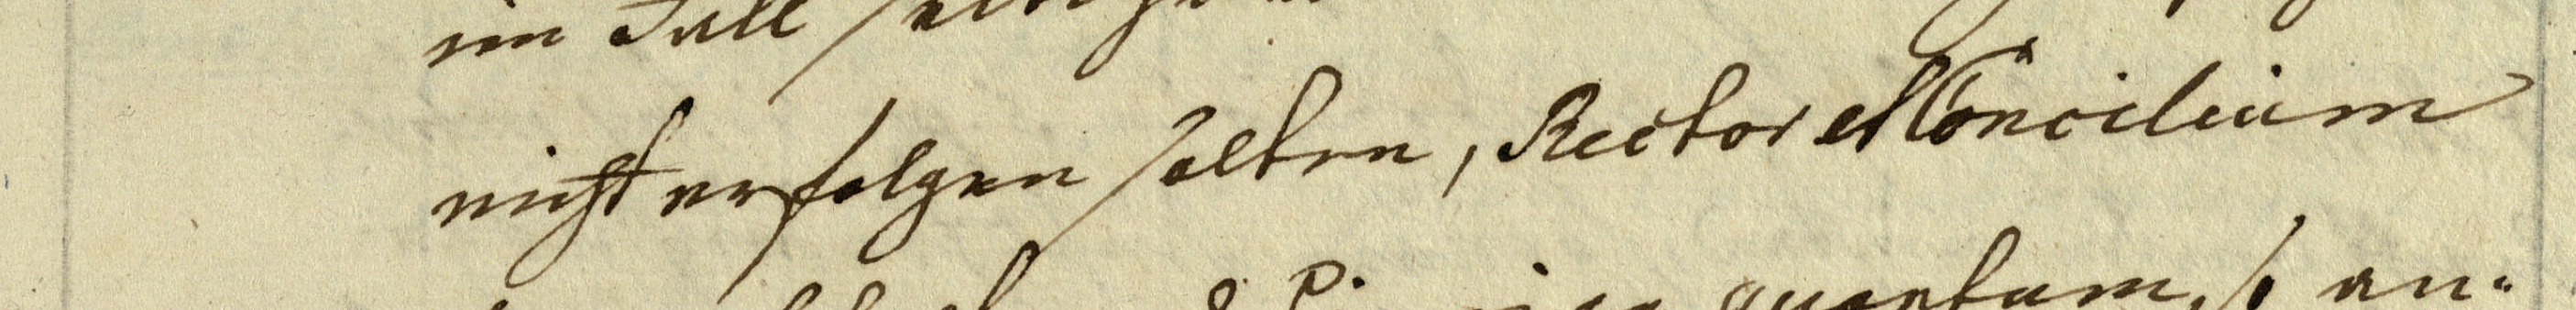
nicht erfolgen solten, Rector et Concilium
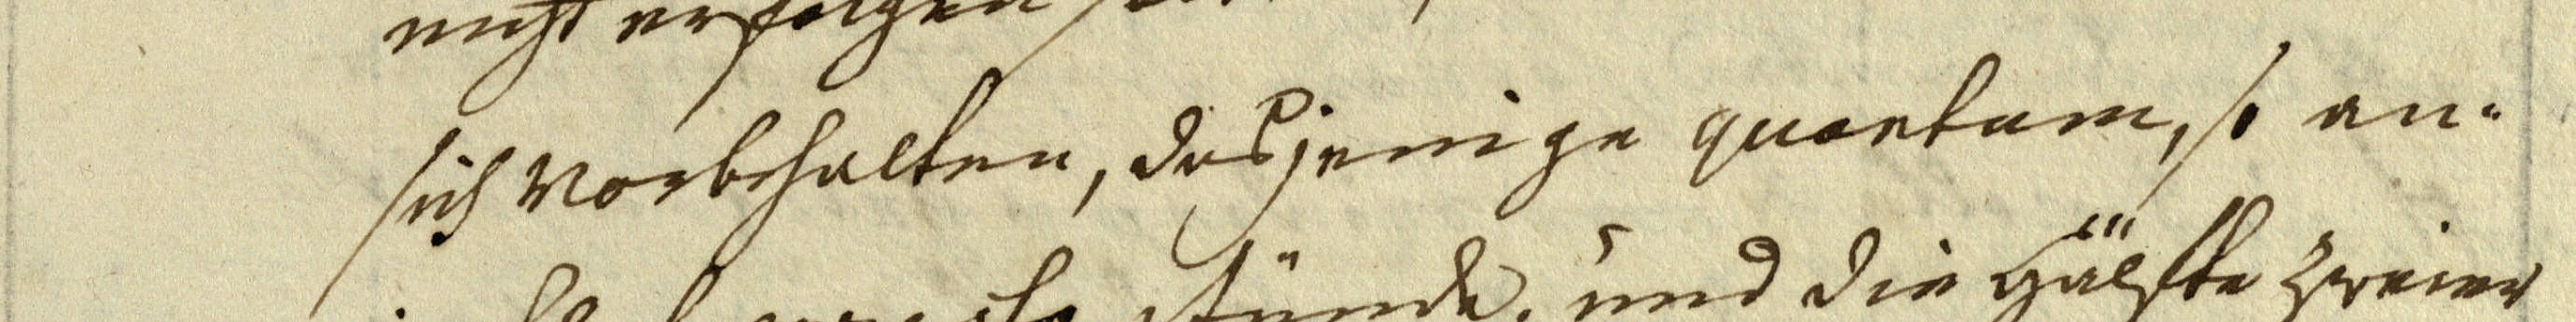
sich vorbehalten, dasjenige quantum, so an¬
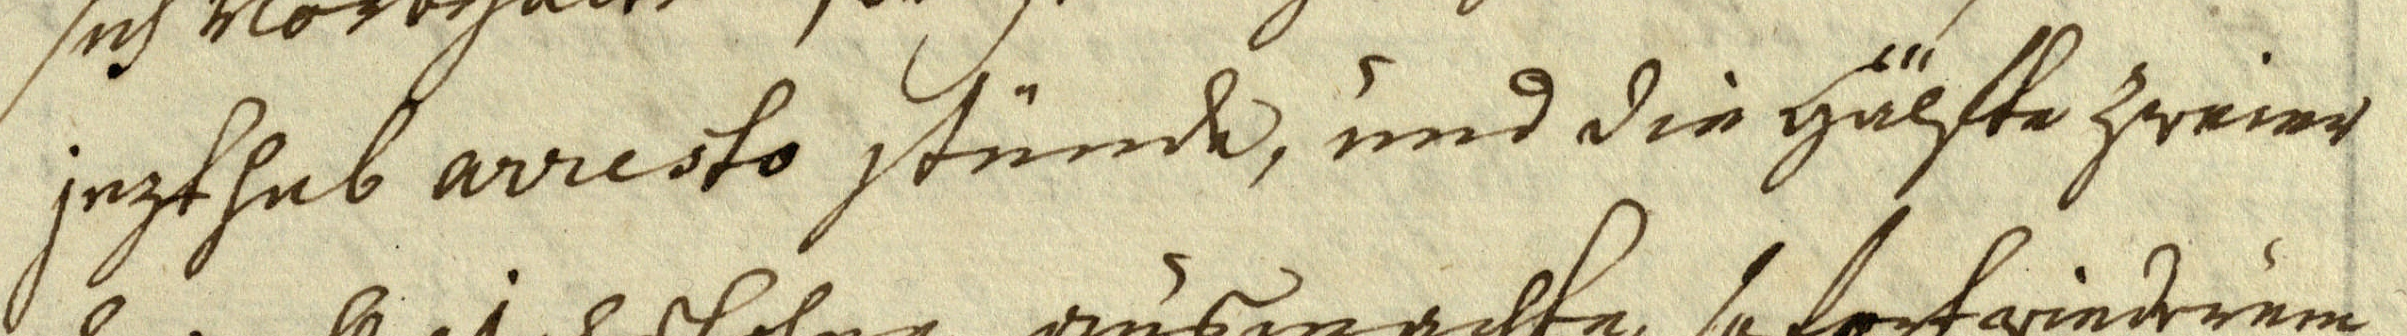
jezt sub arresto stünde, und die Hälfte zweier
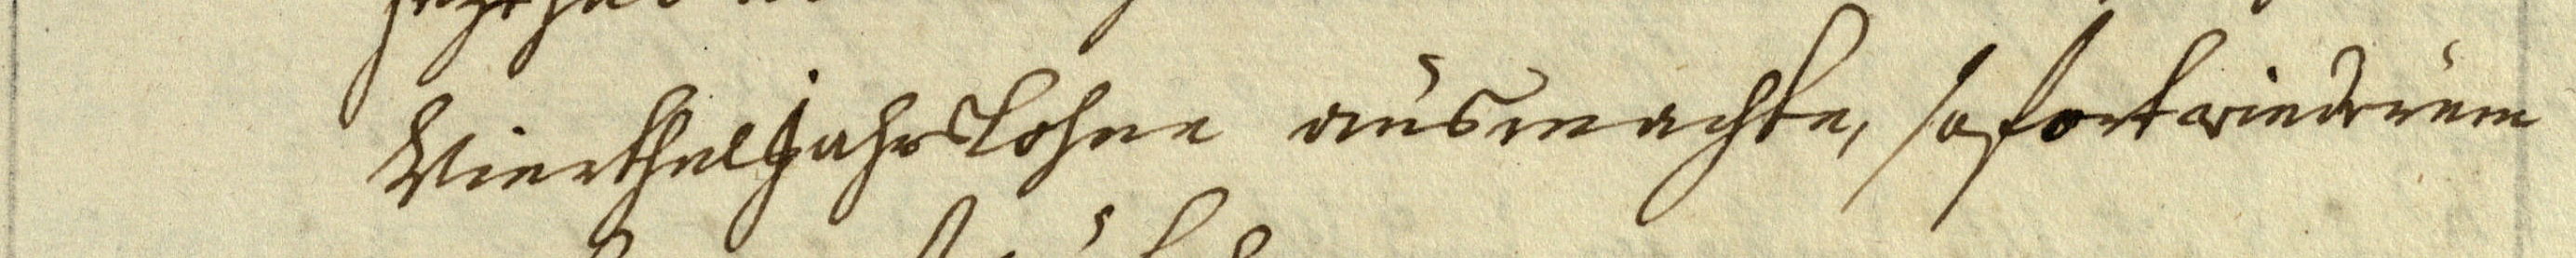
Viertheljahreslohn ausmachte, sofort wiederum
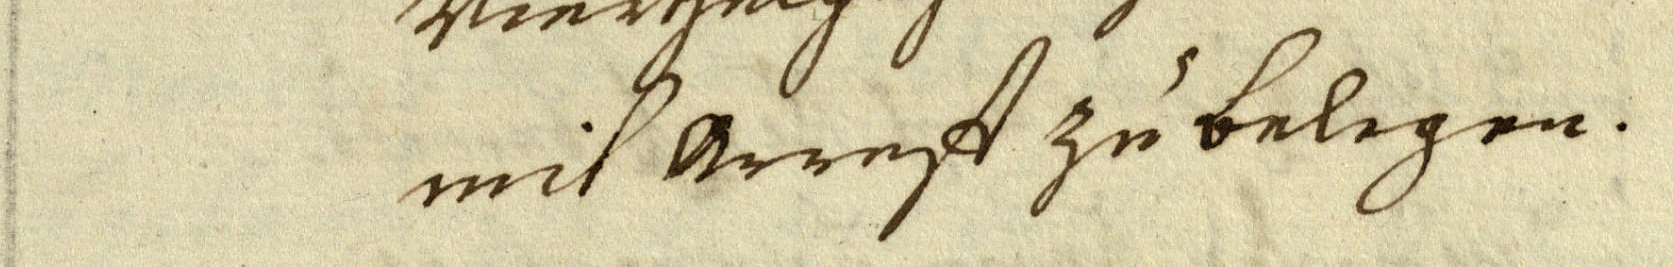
mit Arrest zu belegen.
